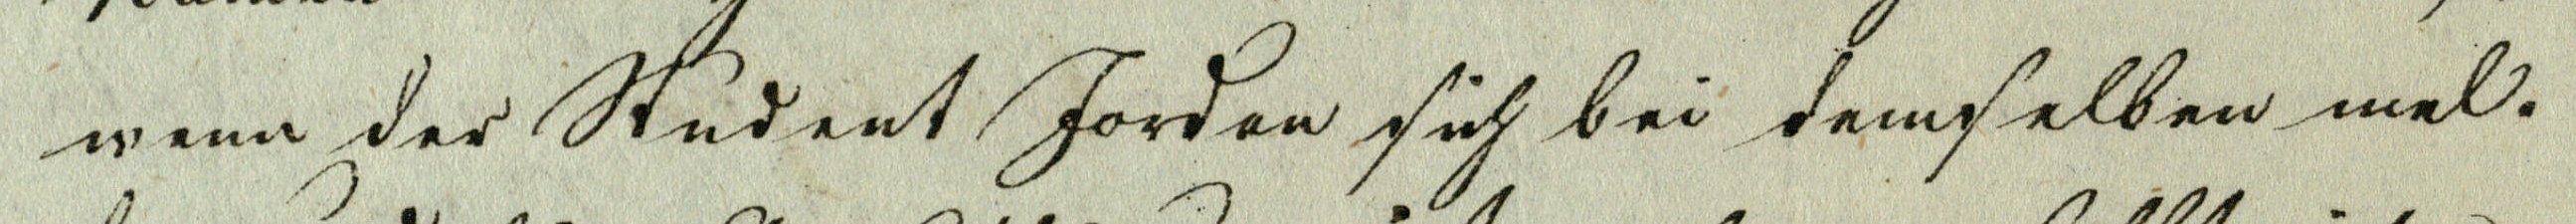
wenn der Student Jordan sich bei demselben mel¬
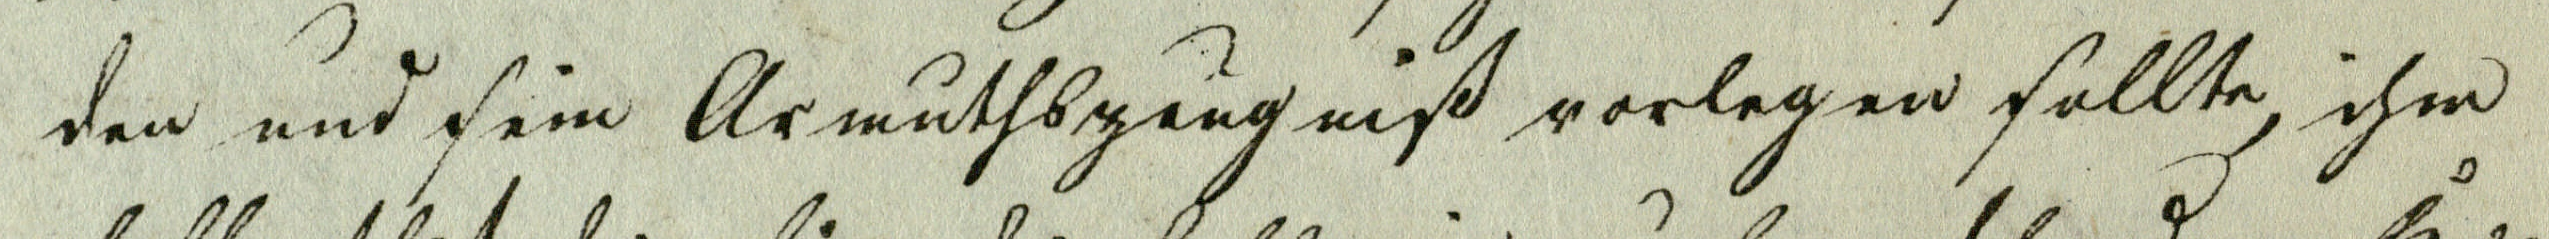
den und sein Armuthszeugniß vorlegen sollte, ihm
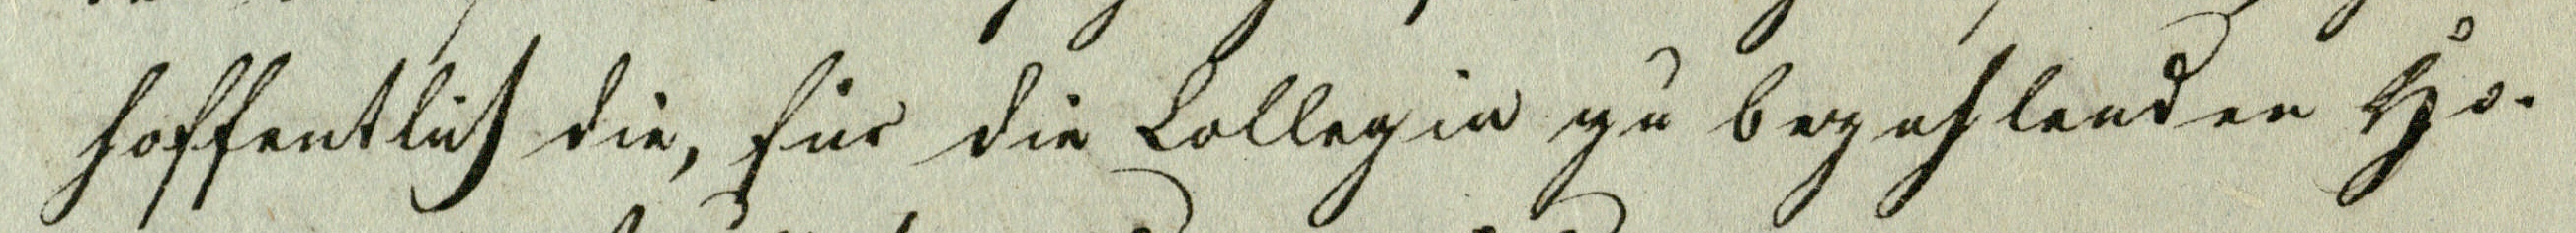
hoffentlich die, für die Collgia zu bezahlenden Ho¬
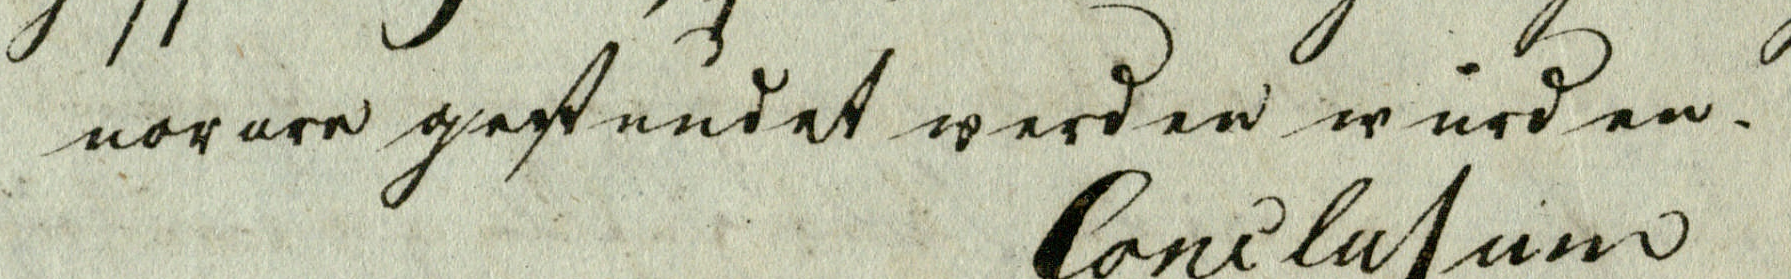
norare gestundet werden würden.
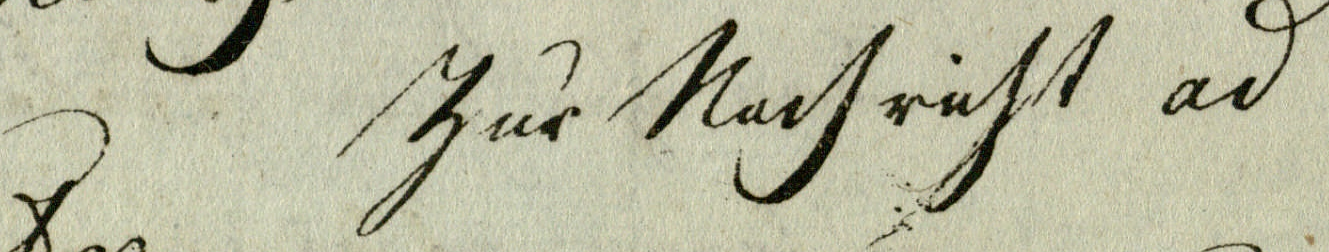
Zur Nachricht ad
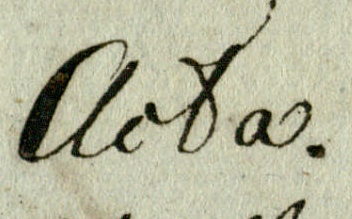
Acta.
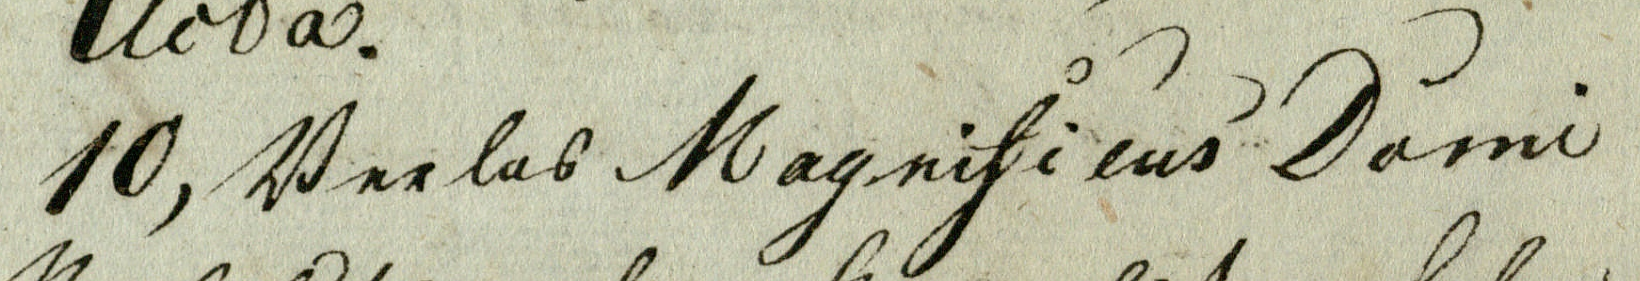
10, Verlas Magnifcus Domi¬
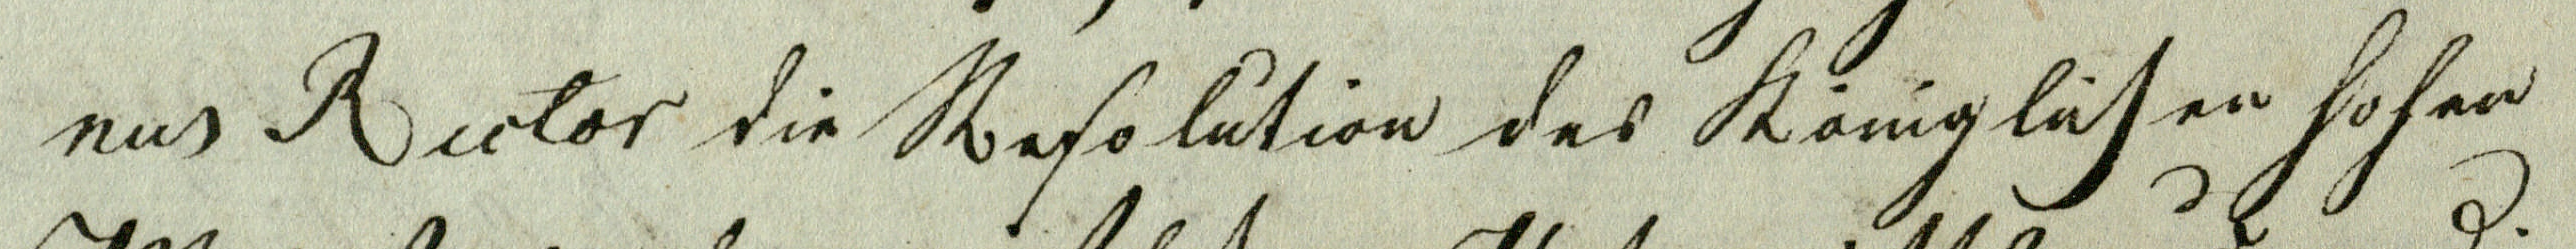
nus Rector die Resolution des Königlichen hohen
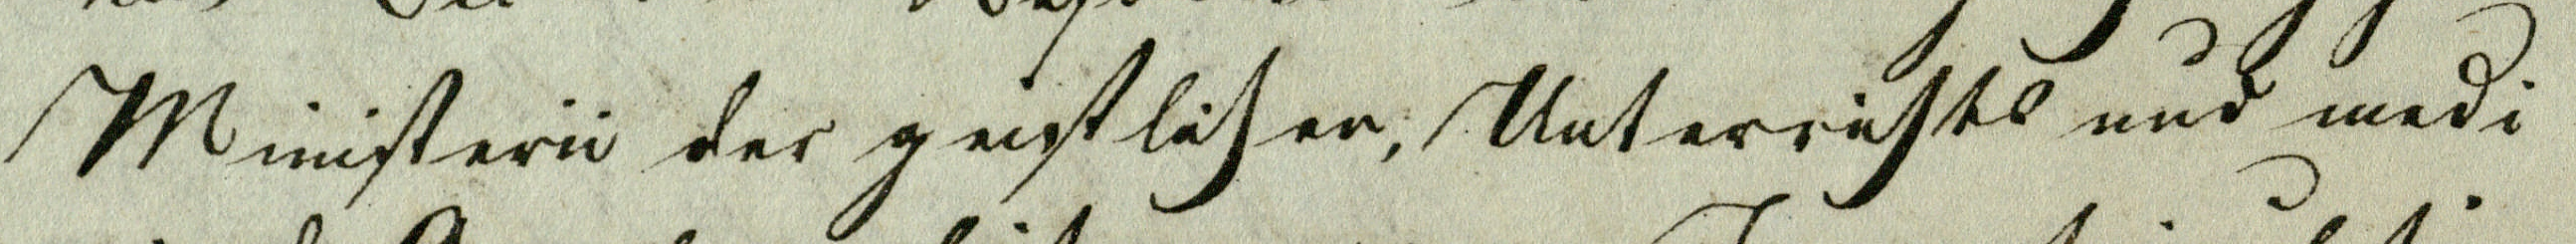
Ministerii der geistlichen, Unterrichts und medi¬
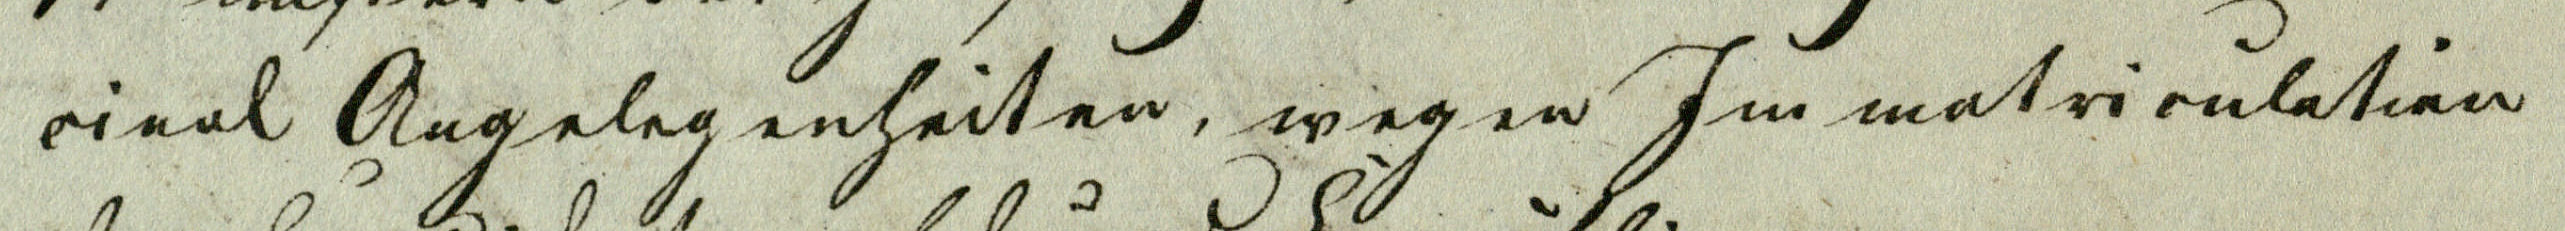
cinal Angelegenheiten, wegen Immatriculation
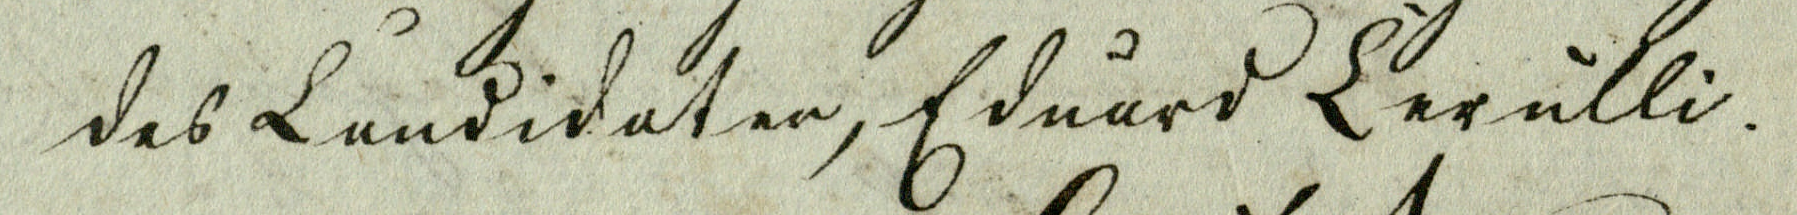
des Candidaten, Eduard Cerulli.
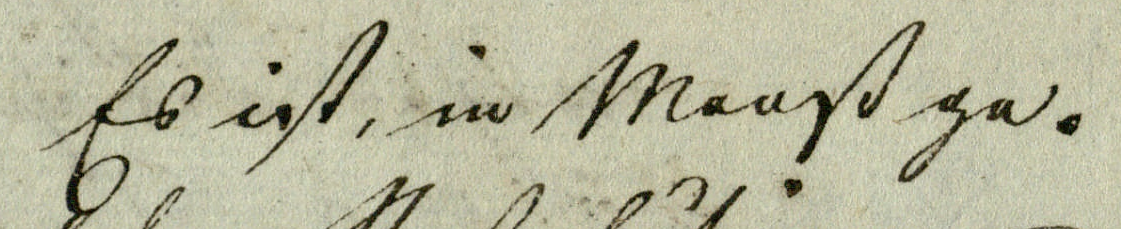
Es ist in Maaßga¬
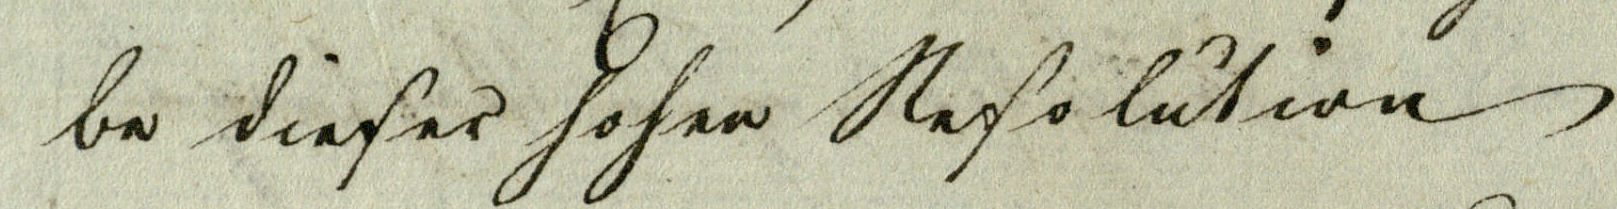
be dieser hohen Resolution
